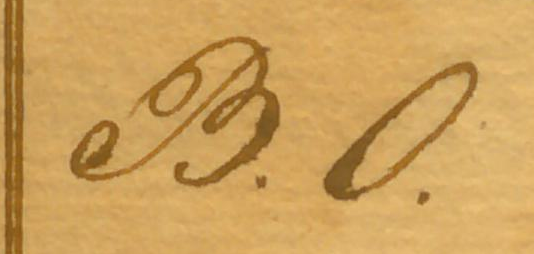B. O.
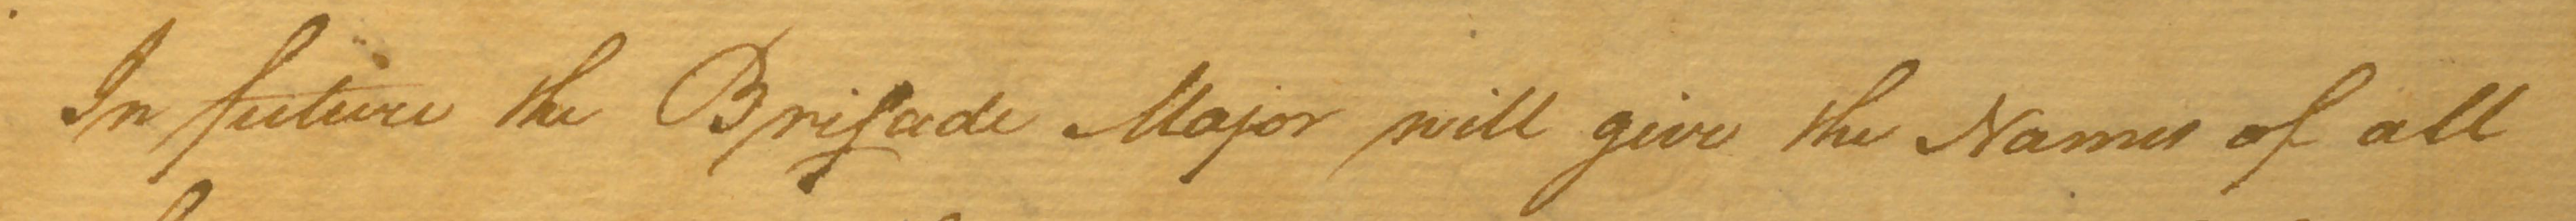In future the Brigade Major will give the Names of all
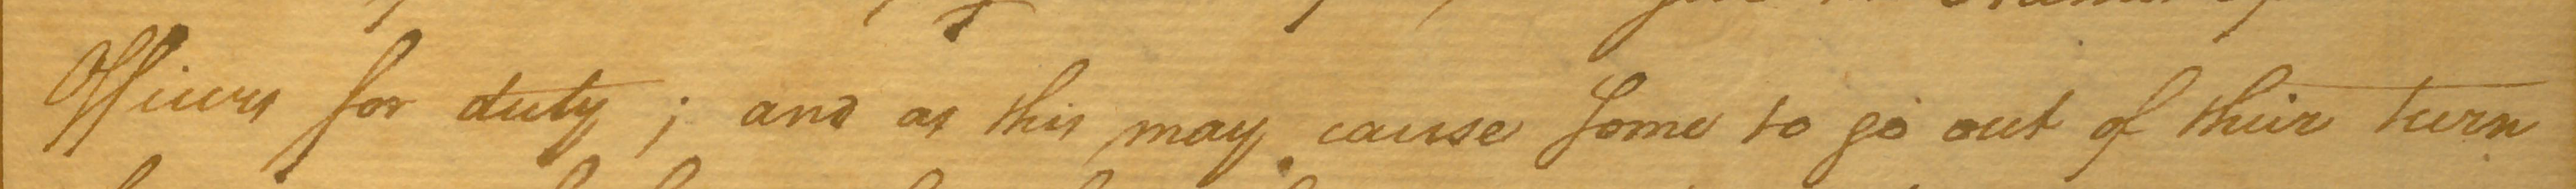Officers for duty; and as they may cause some to go out of their turn
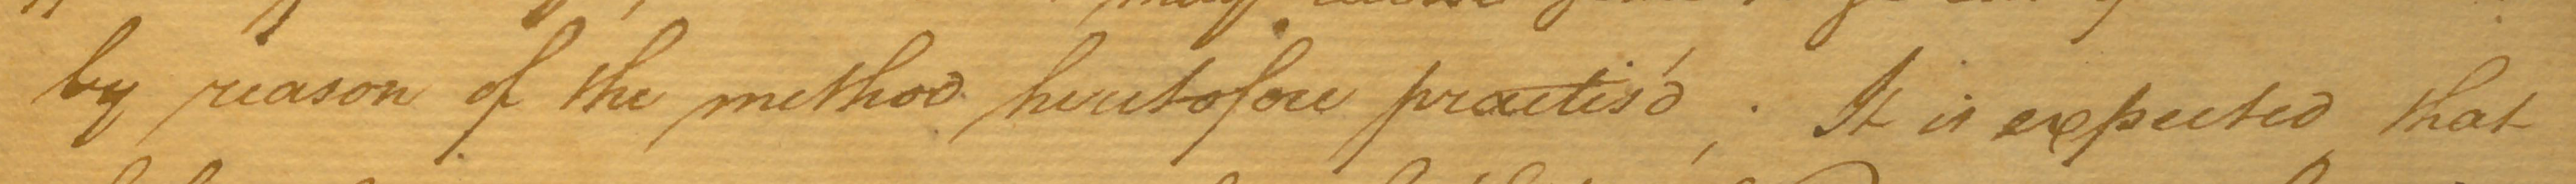by reason of the method heretofore practis'd; It is expected that
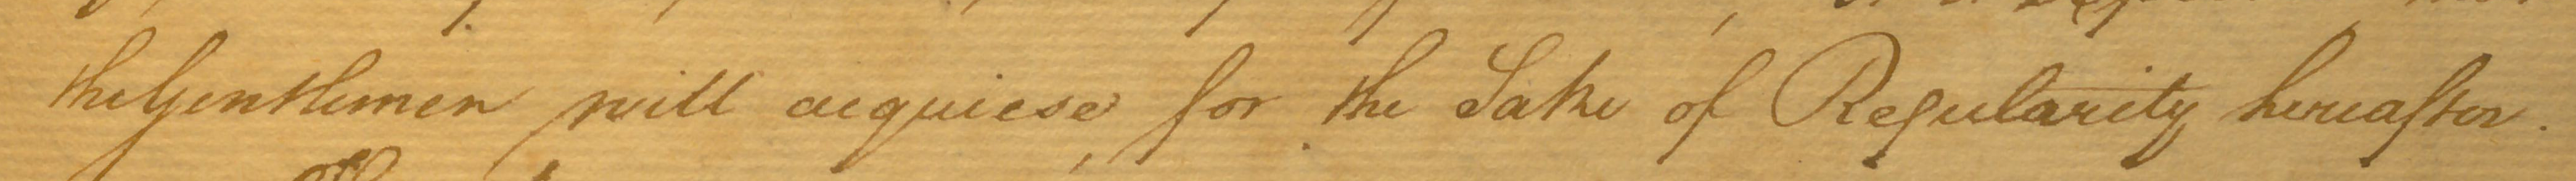the Gentleman will acquiese, for the Sake of Regularity hereafter.
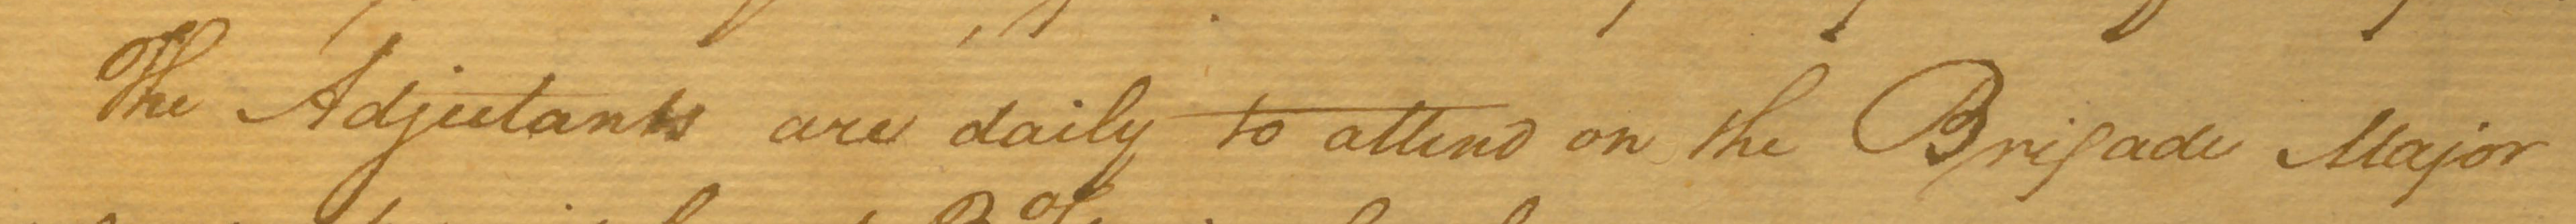The Adjutants are daily to attend on the Brigade Major
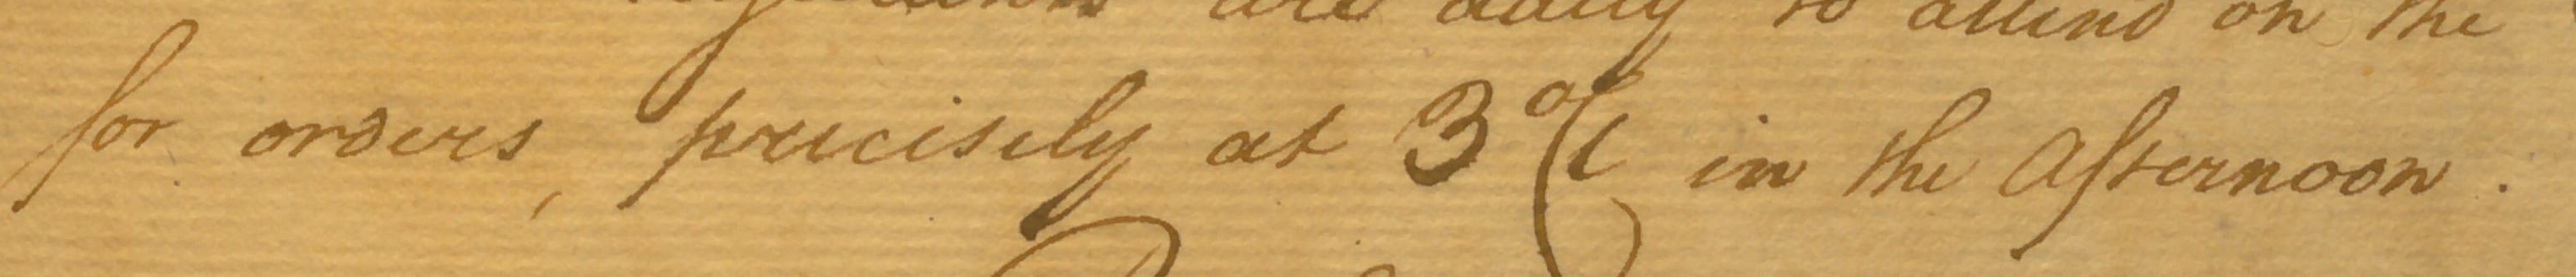for orders, precisely at 3 ^oCl in the afternoon.
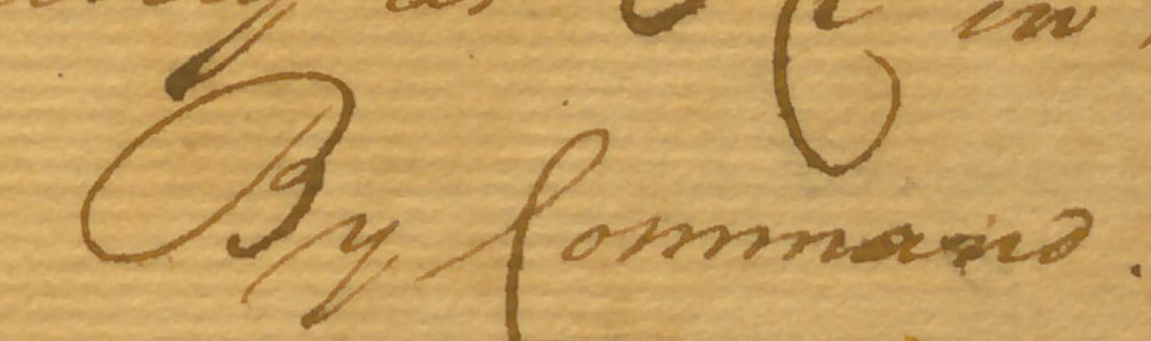By Command
